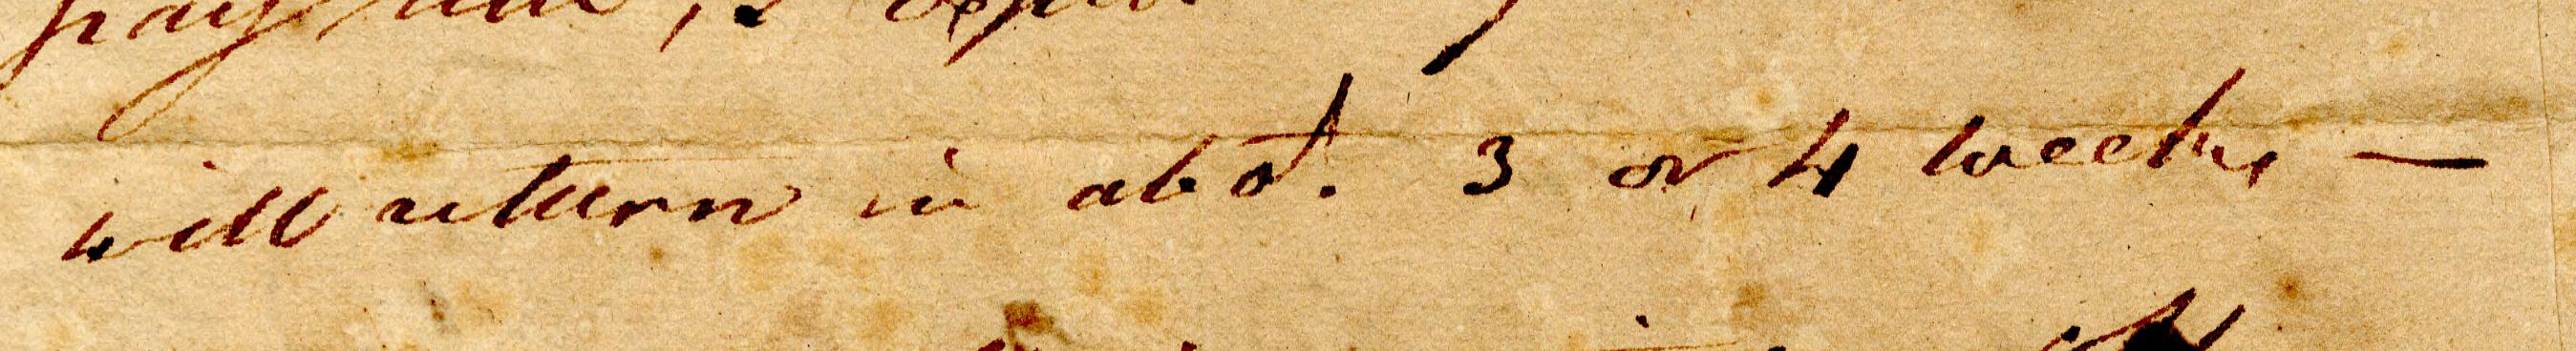will return in abo^t. 3 or 4 weeks-
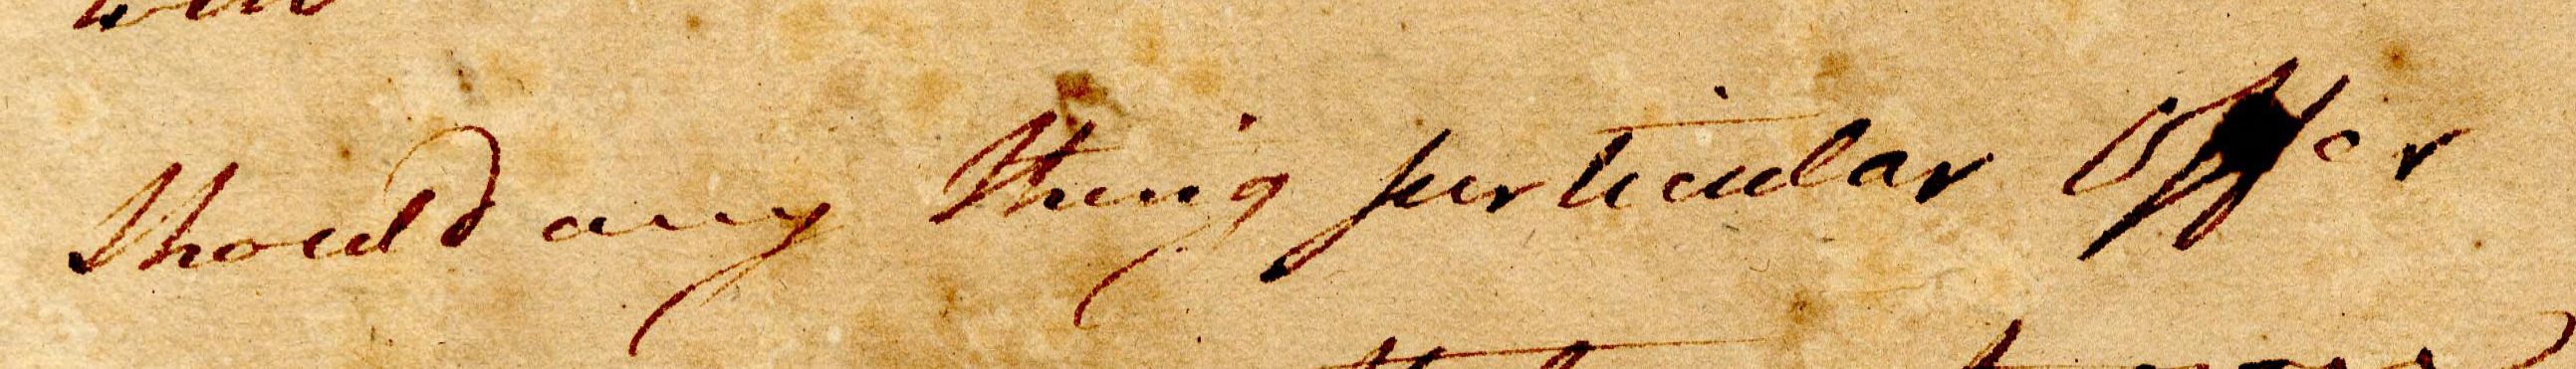should any thing particular offer
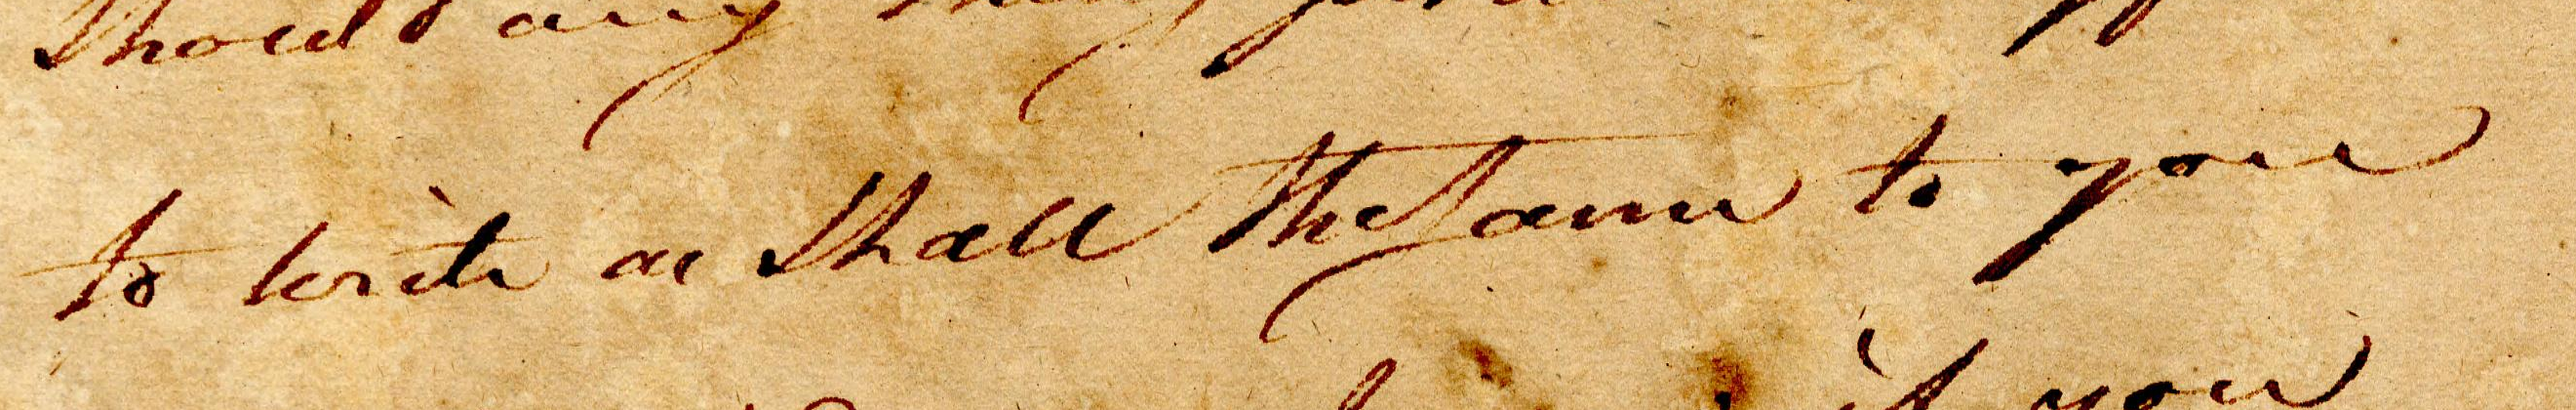to write as shall the same to you
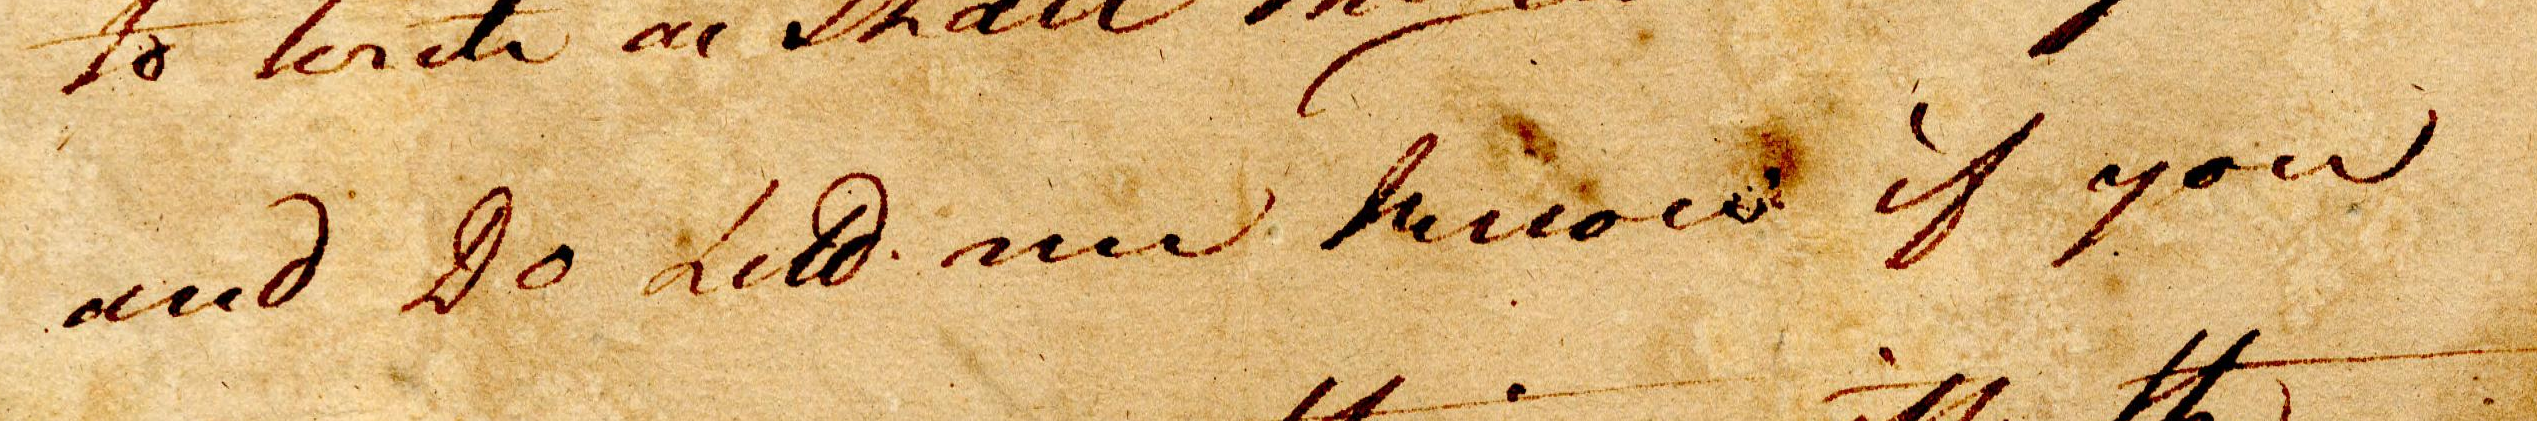and Do Lett me know if you
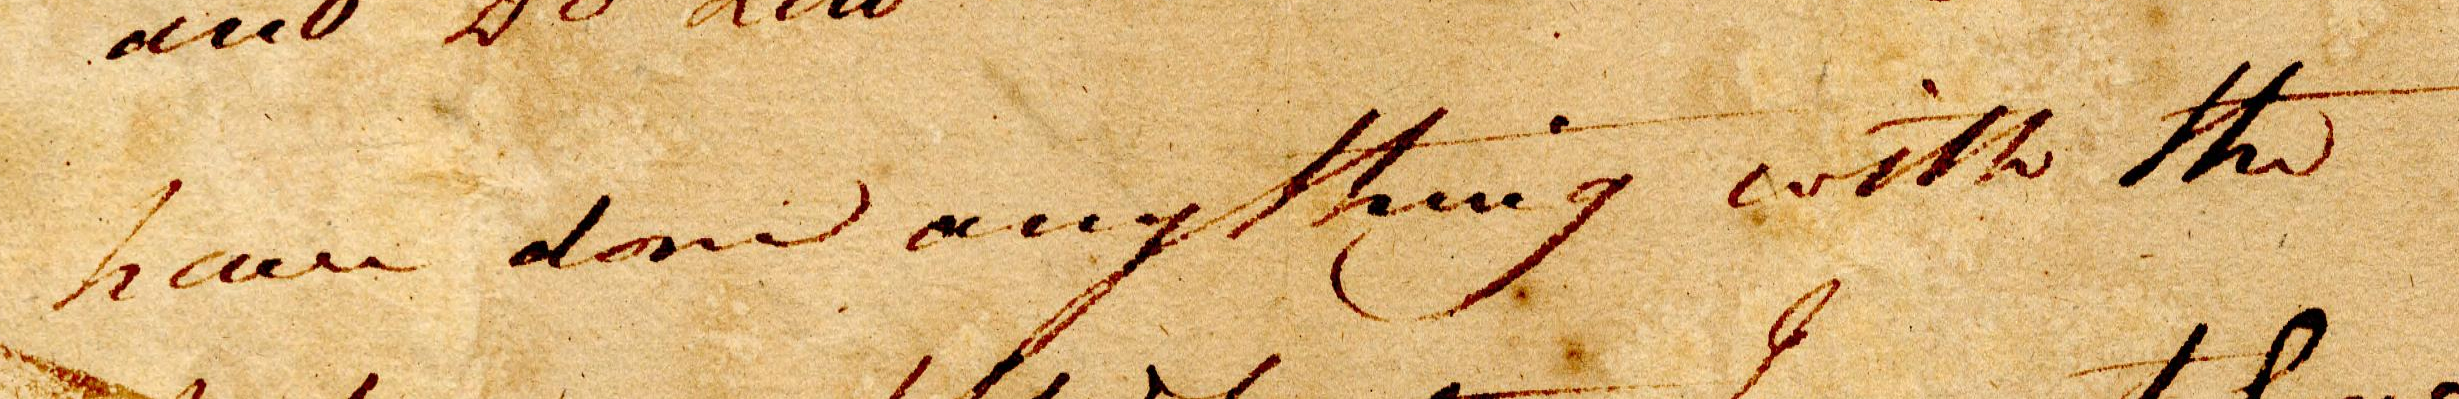have done anything with the
